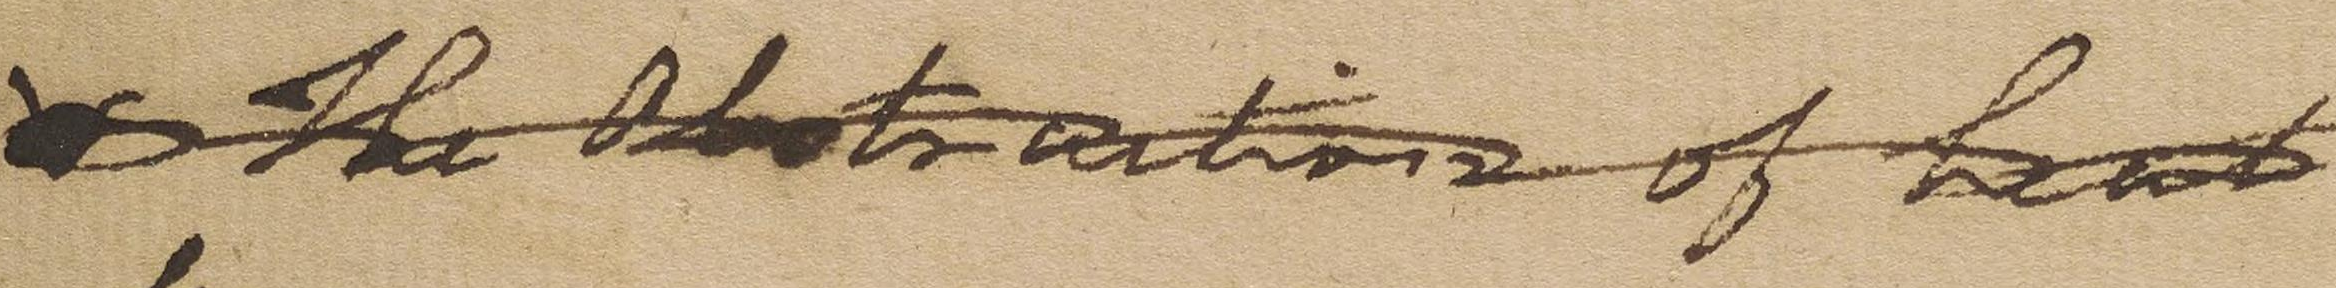[The abstractions of heat]
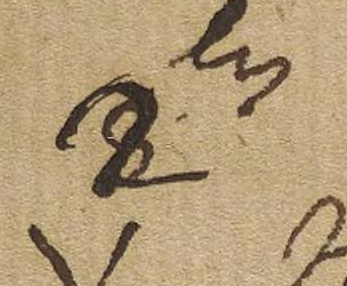2^ly
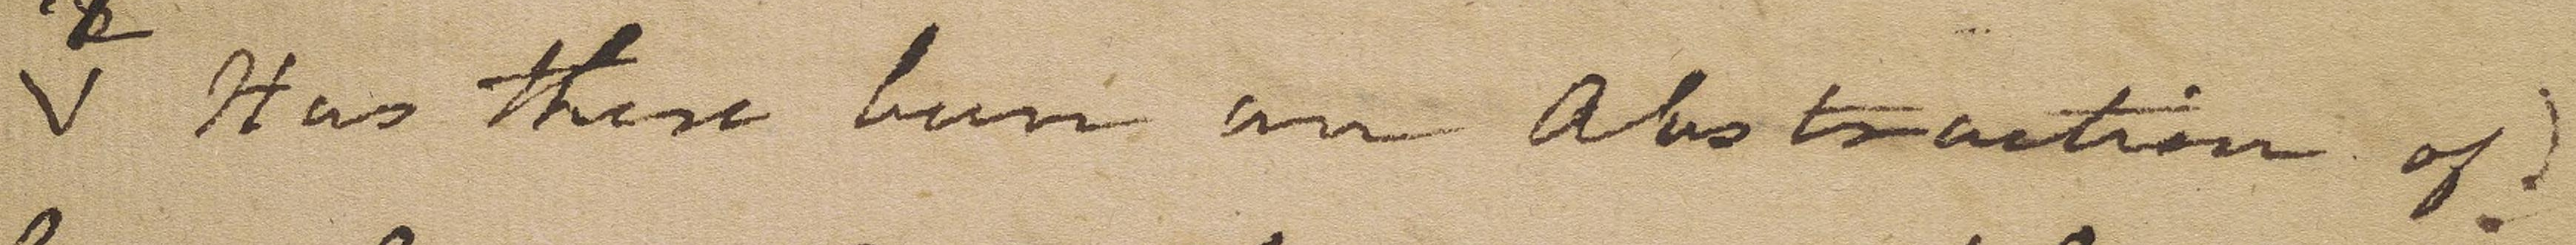V has there been an abstraction of
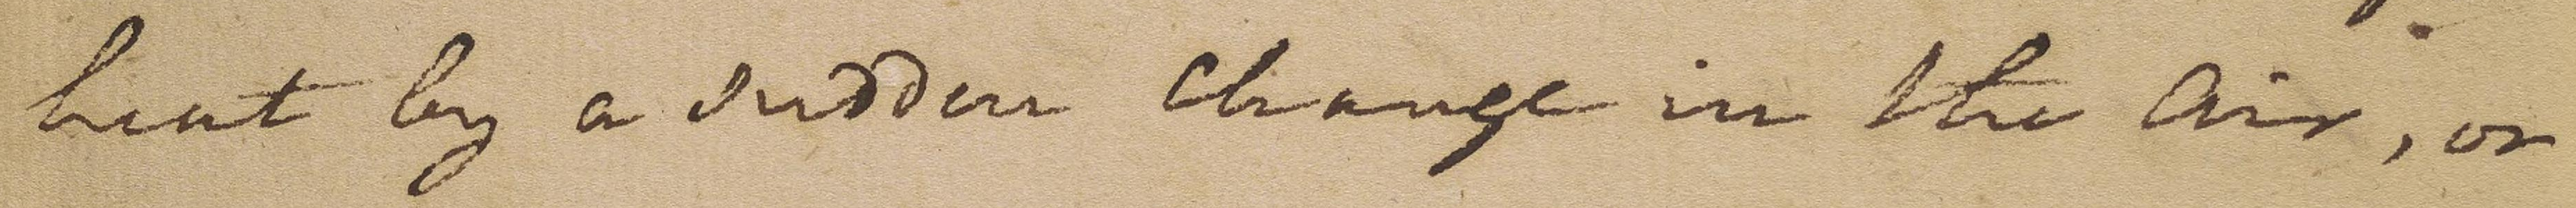heat by a sudden change in the air, or
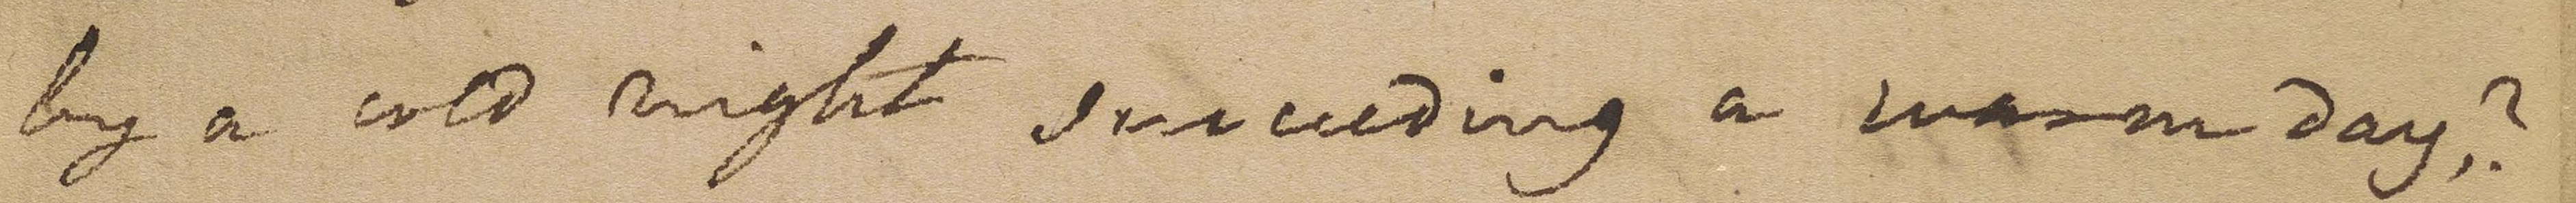by a cold night succeeding a warm day?
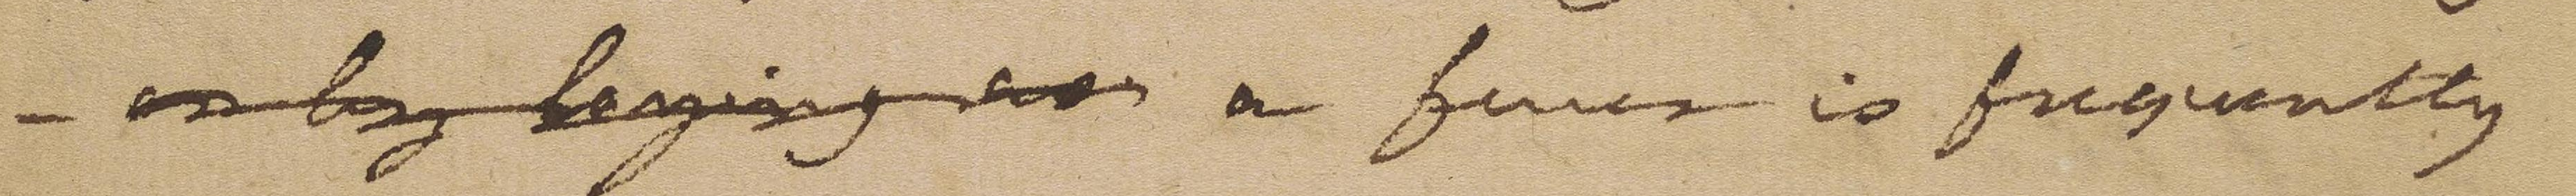- [as by laying as] a fever is frequently
